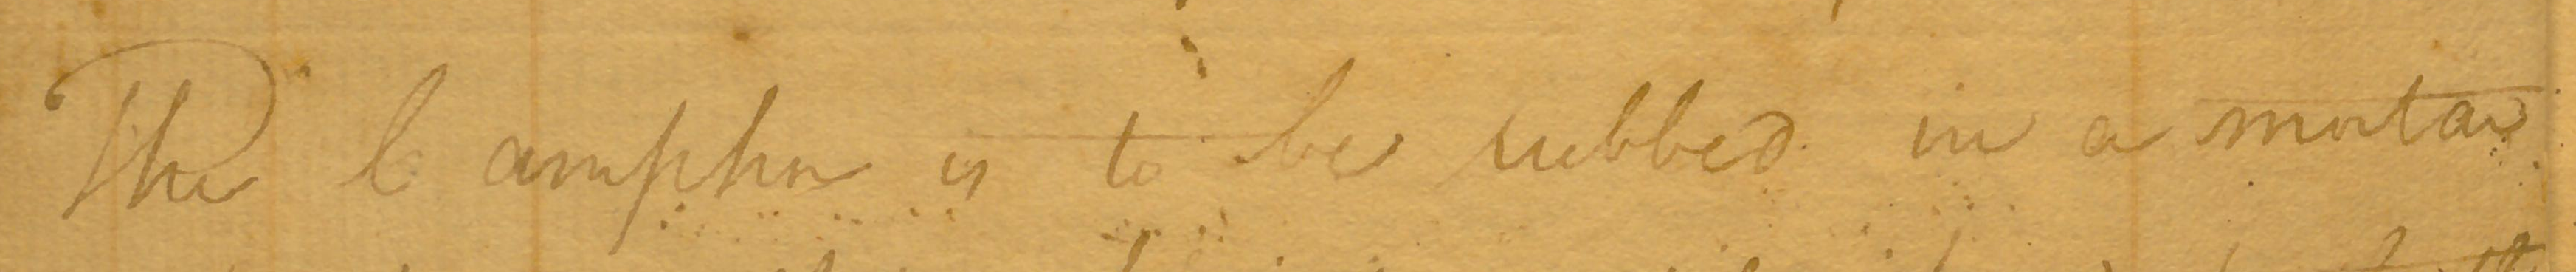The Camphr is to be rubbed in a mortar
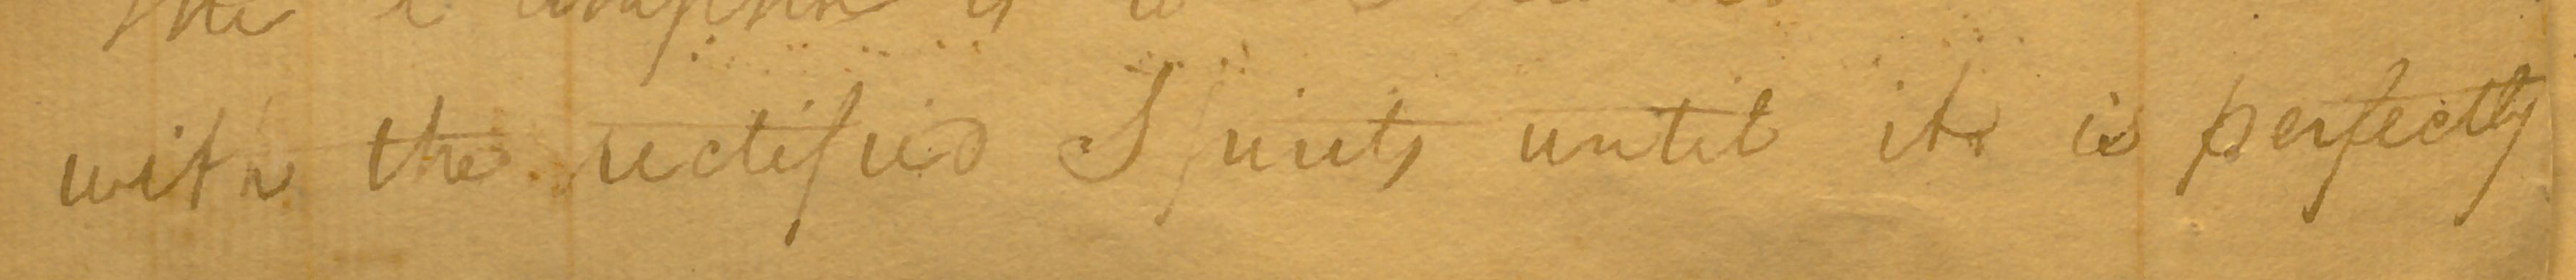with the rectified Spirit, until it is perfectly
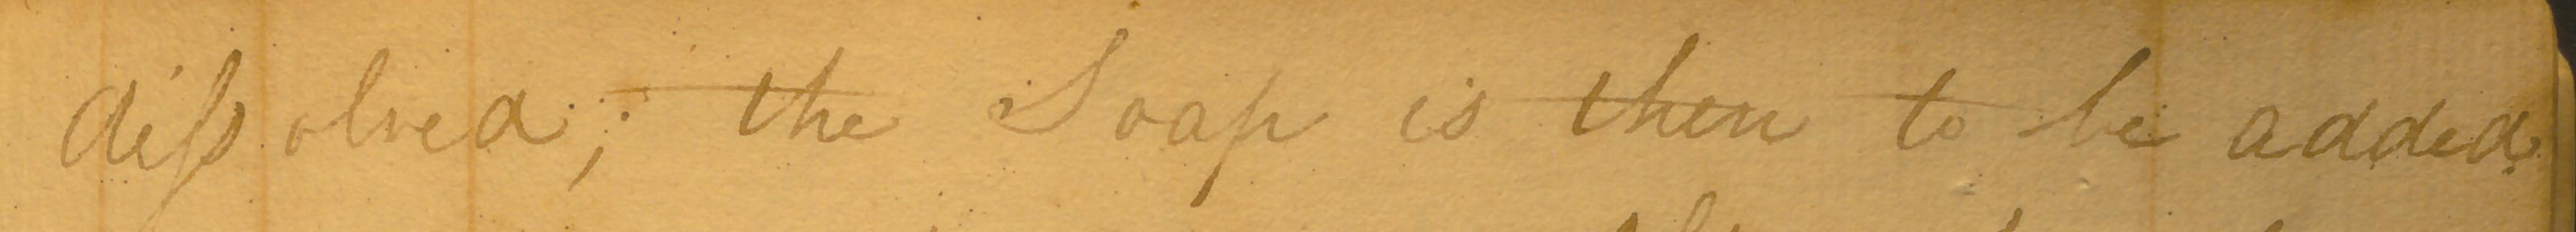dissolved; the soap is then to be added
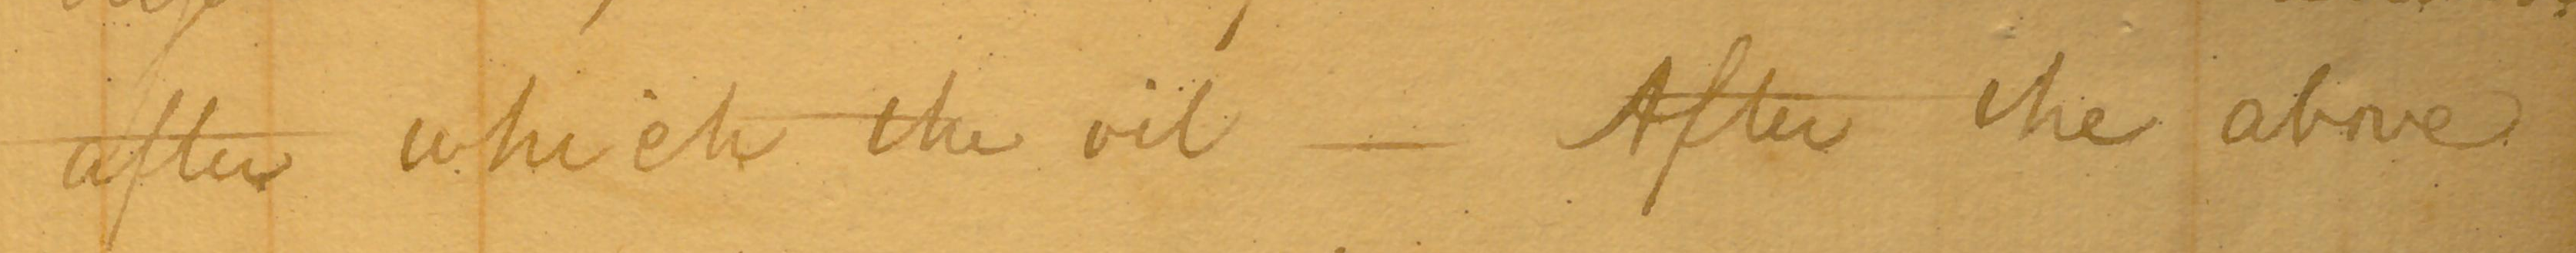after which the oil- After the above
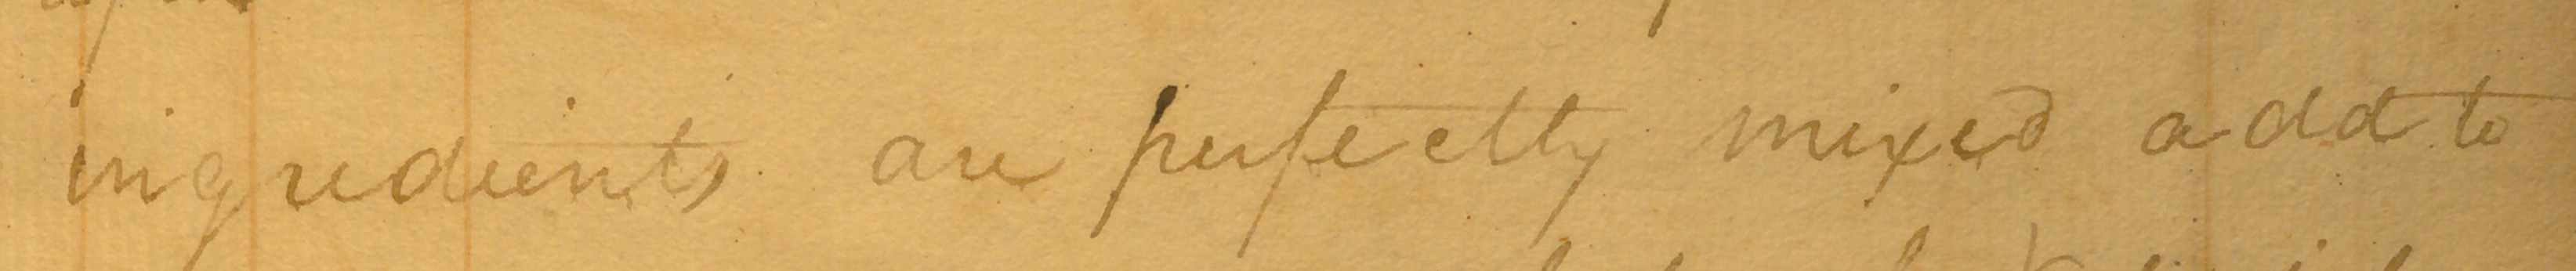ingredients are perfectly mixed add to
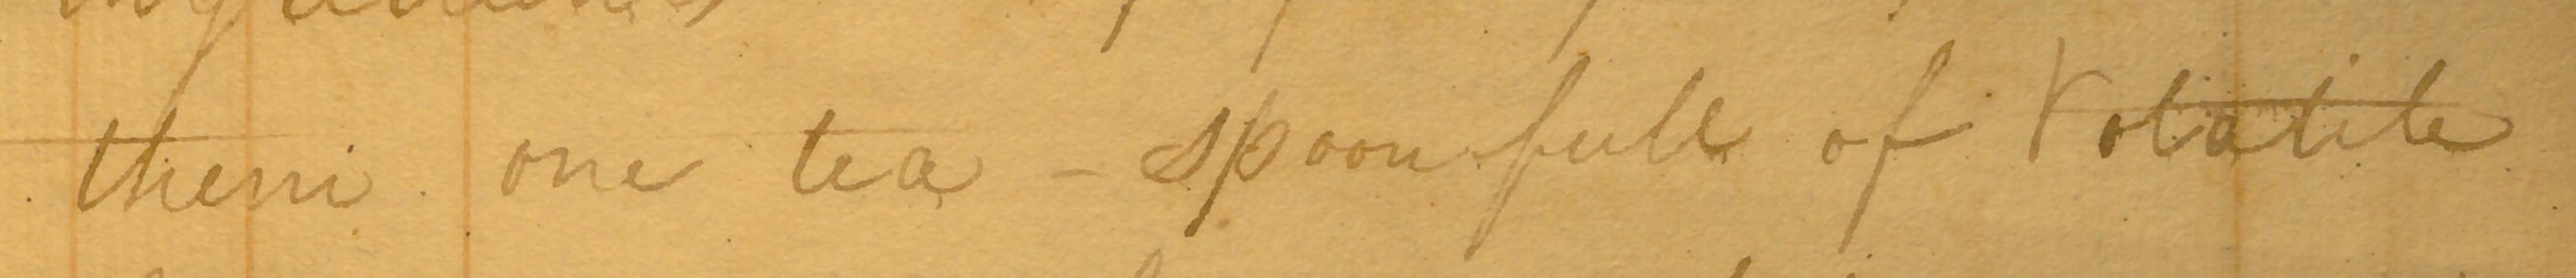them one tea-spoonfull of Volatitle
